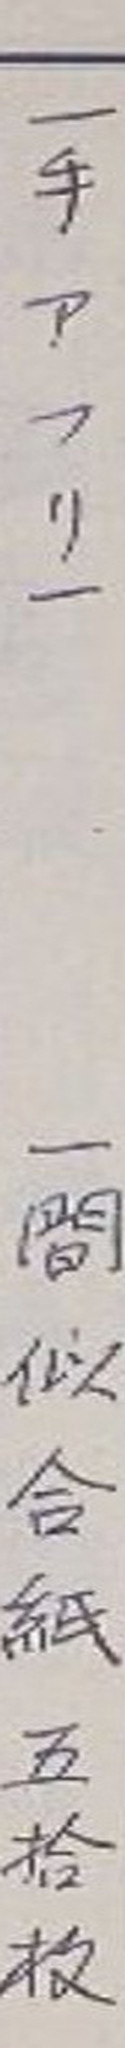一手あふり一一間似合紙五拾枚
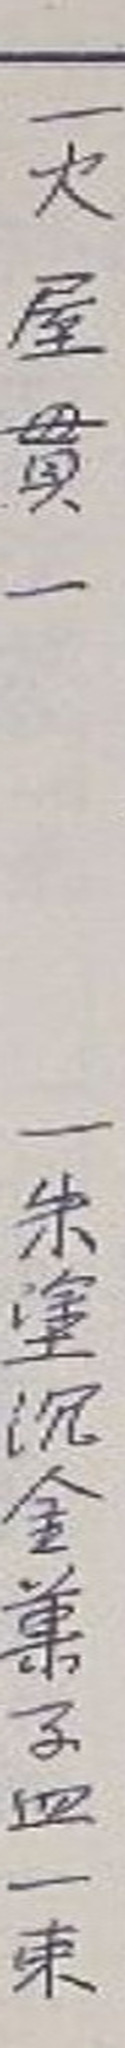一火屋貫一一朱塗沈金菓子皿一束
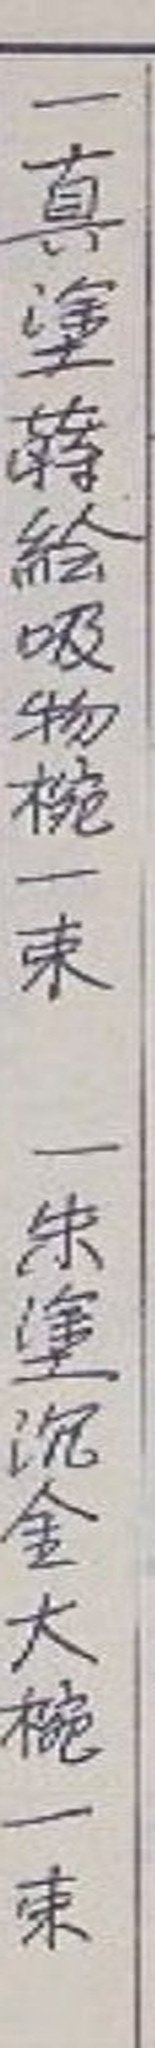一真塗蒔絵吸物椀一束一朱塗沈金大碗一束
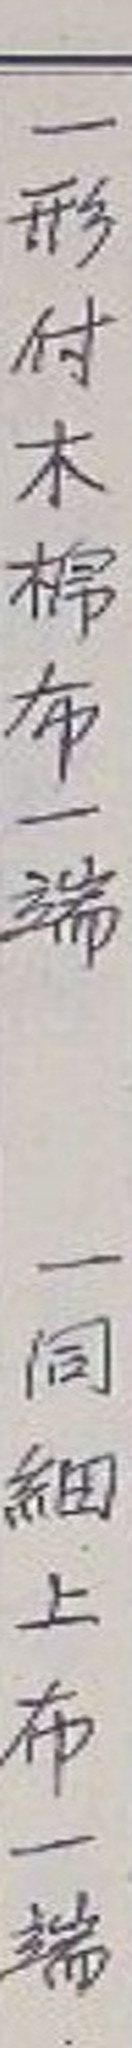一形付木棉布一端一同細上布一端
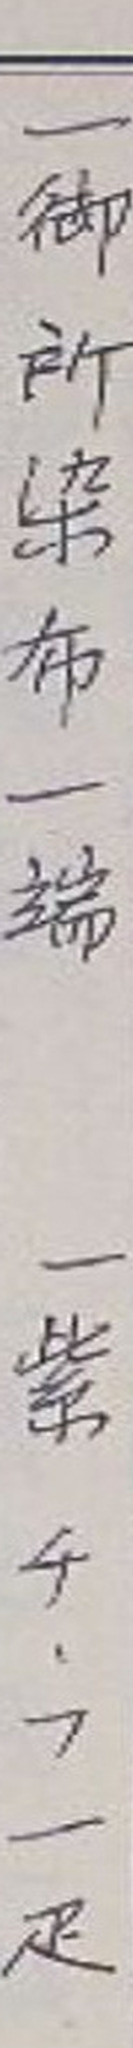一御所染布一端一紫チーフ一疋
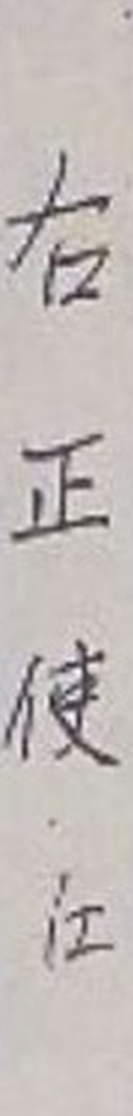右正使え
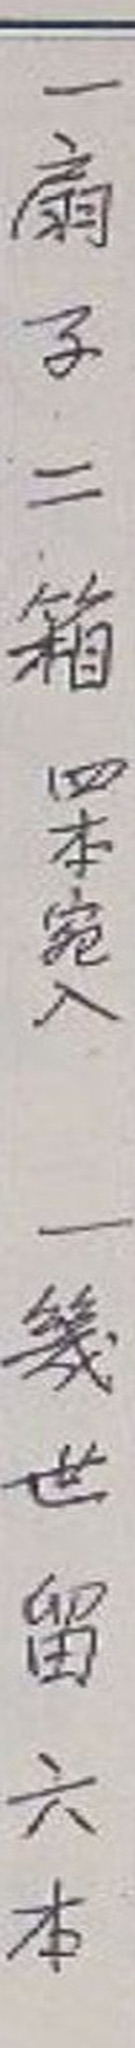一扇子二箱四本宛入一幾世留六本
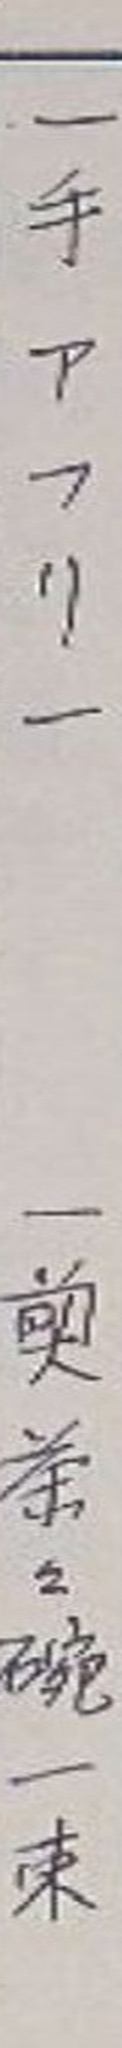一手あふり一一煎茶々碗一束
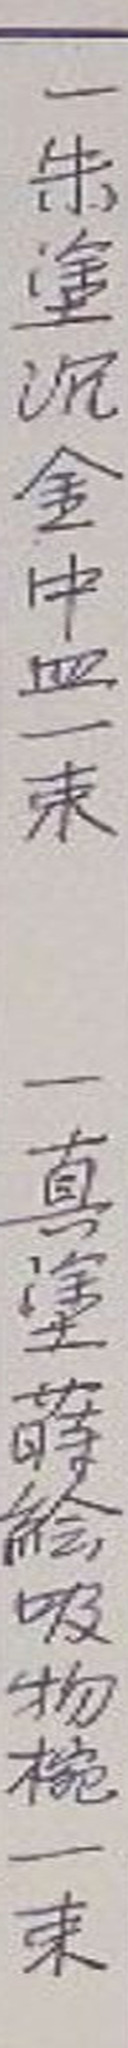一朱塗沈金中皿一束一真塗蒔絵吸物椀一束
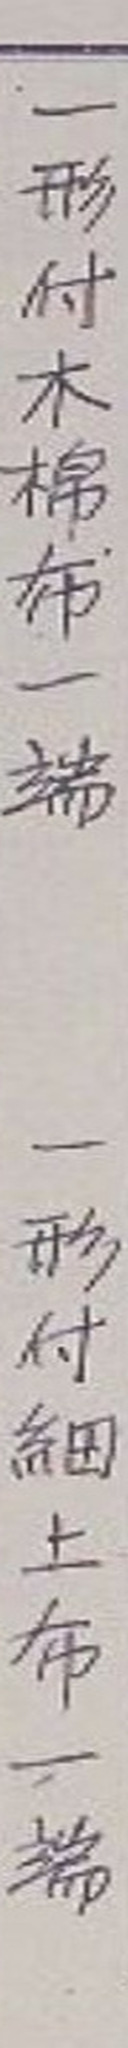一形付木棉布一端一形付細上布一端
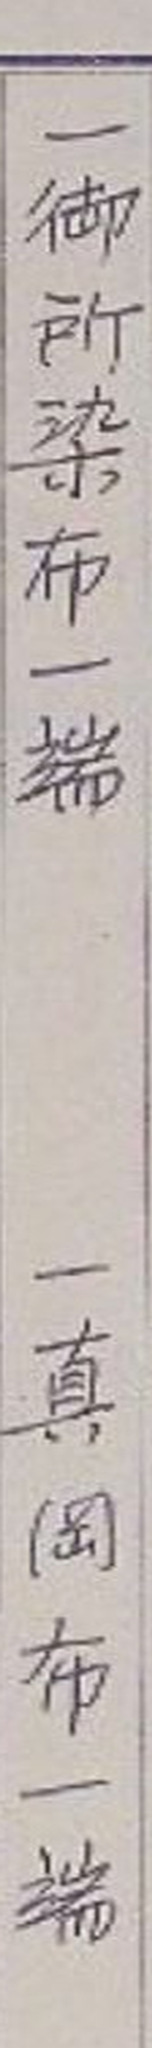一御所染布一端一真岡布一端

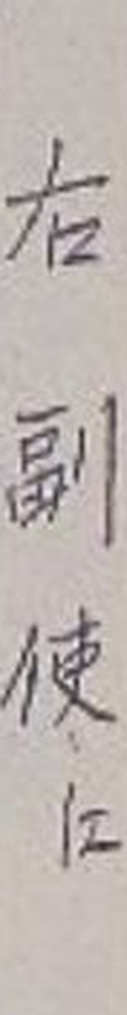右副使え
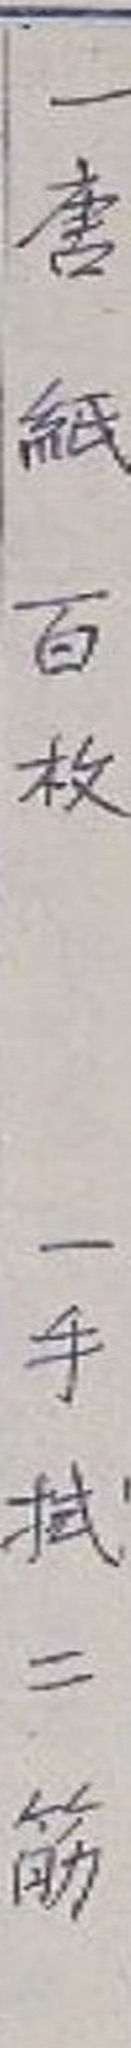一唐紙百枚一手拭二筋
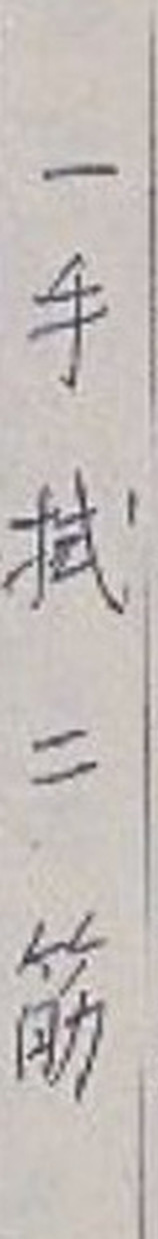一唐紙百枚一手拭二筋
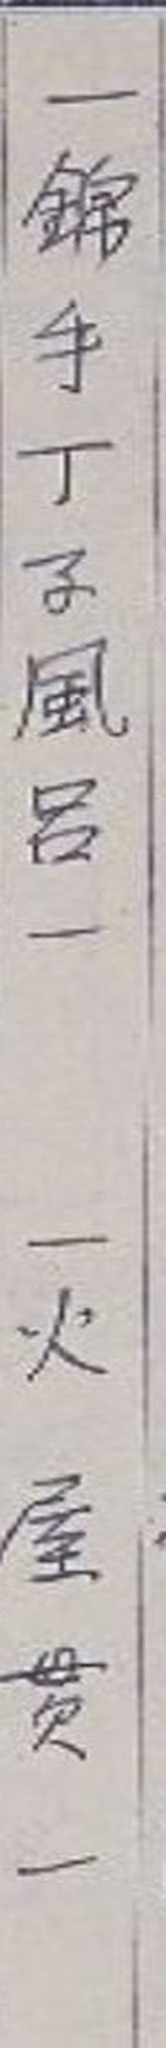一錦手丁子風呂一一火屋貫一
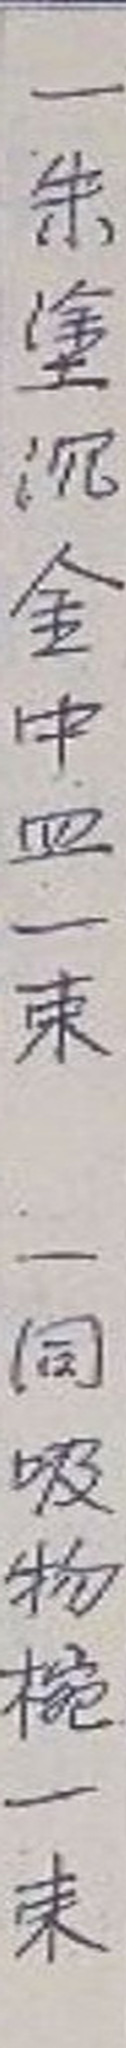一朱塗沈金中皿一束一同吸物椀一束
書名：支那冊封使来琉諸記 下巻
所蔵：University of the Ryukyus Library
